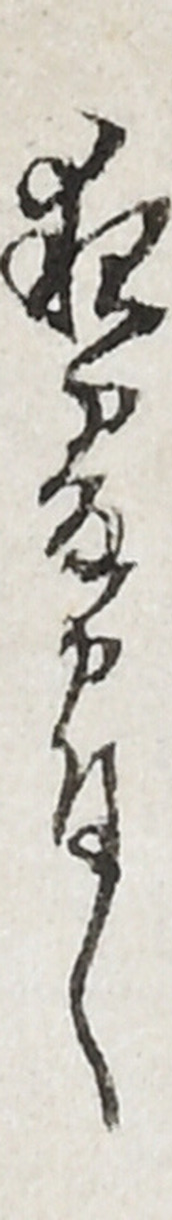夜番申付候
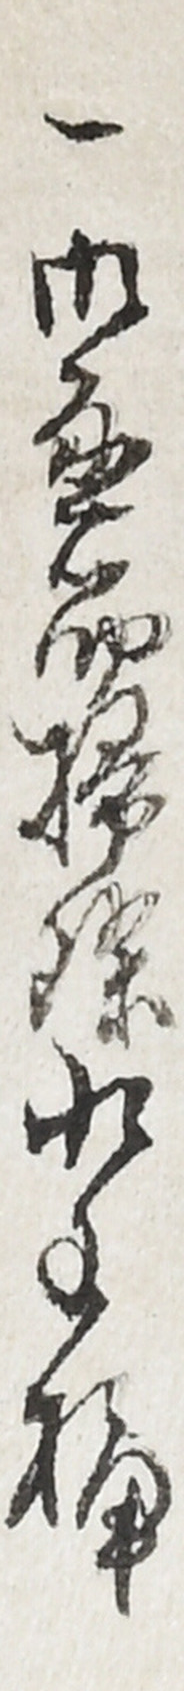一御通筋掃除水手桶
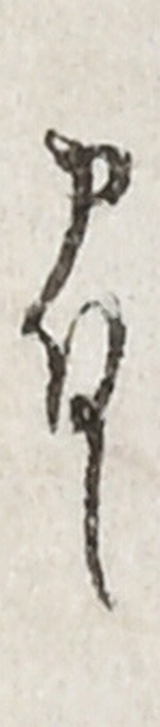申付候
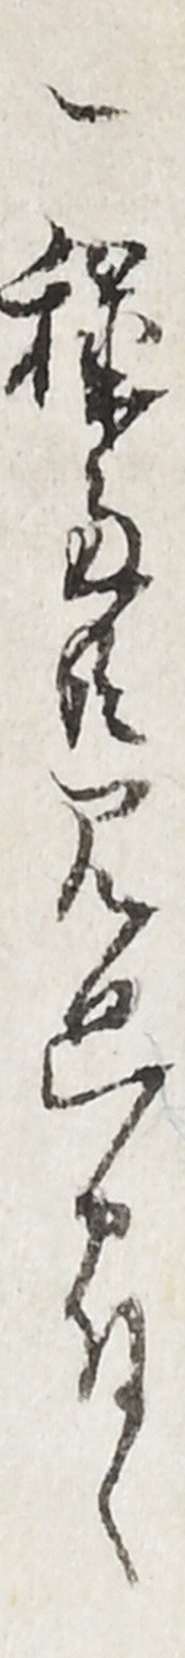一穢多共見廻申付候
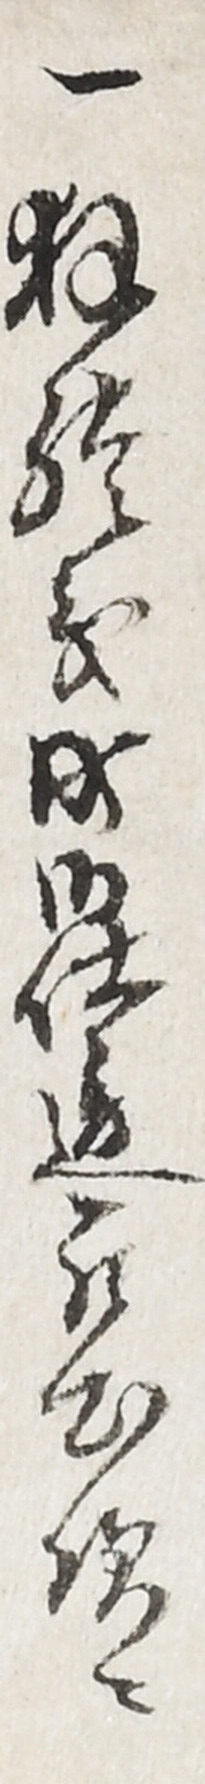一拝礼義町御仕送罷出次ニ
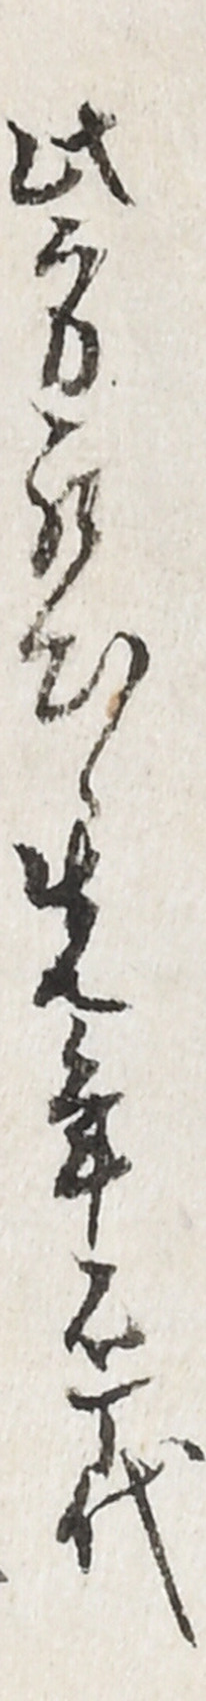此方罷出候先年は丁代
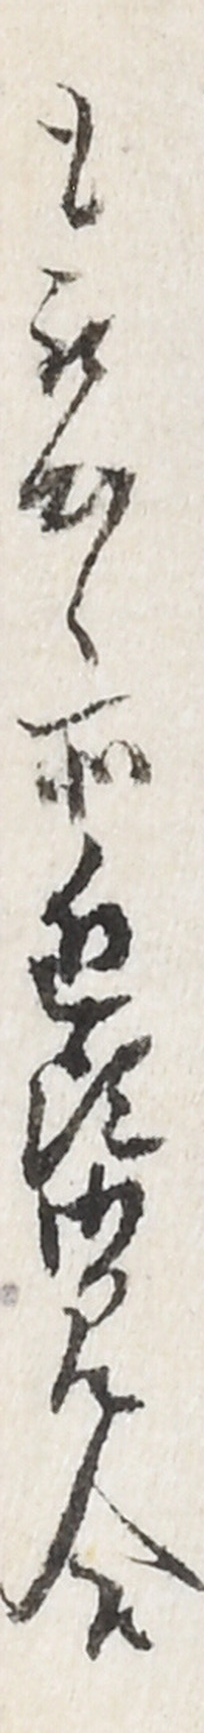も被出候所近頃御見合
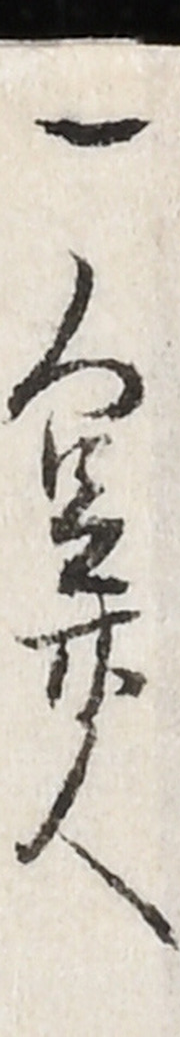一人足廿人
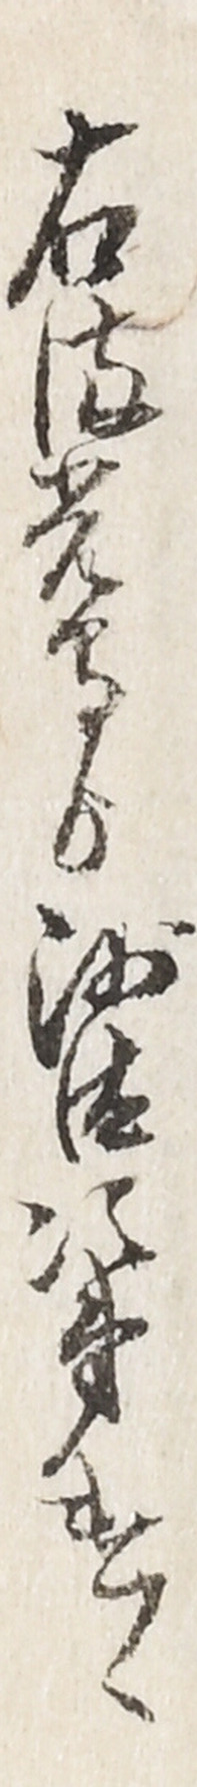右満光寺より沙汰次第遣候
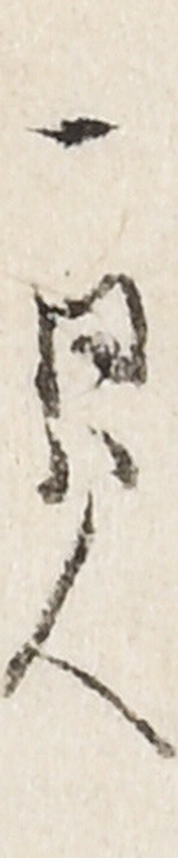一同八人
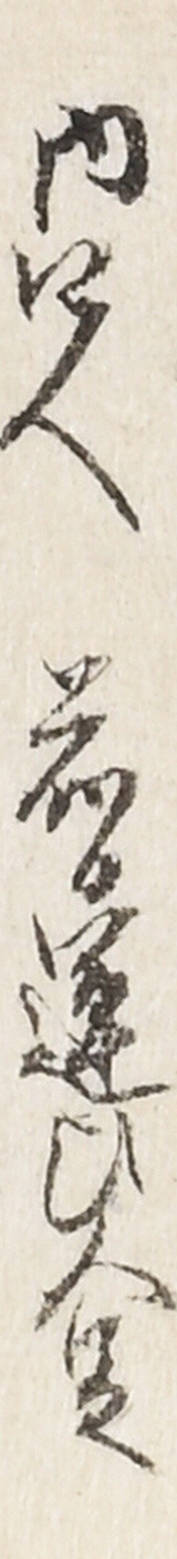内四人前日運ひ人足
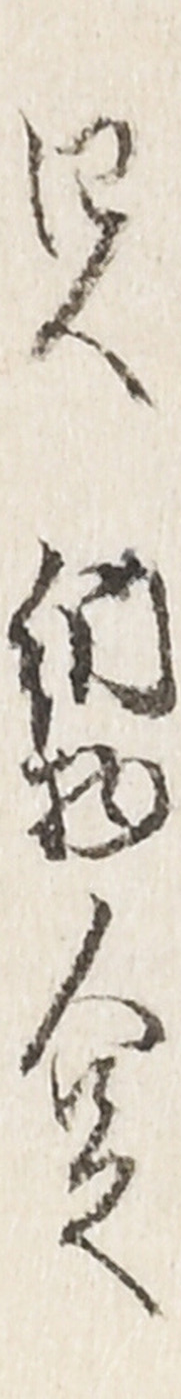四人納物人足
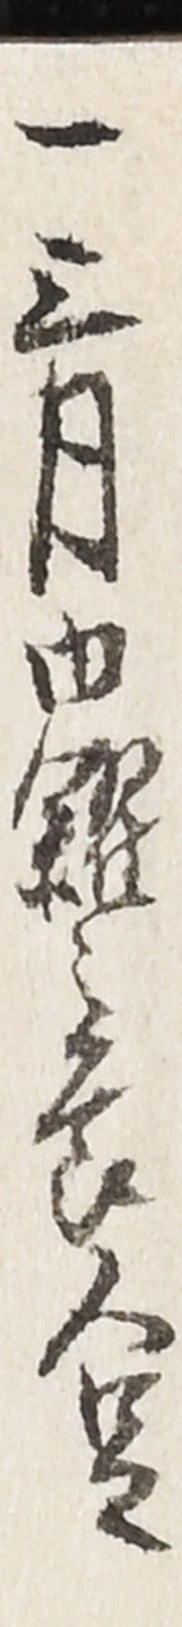一三月御鑼之節人足
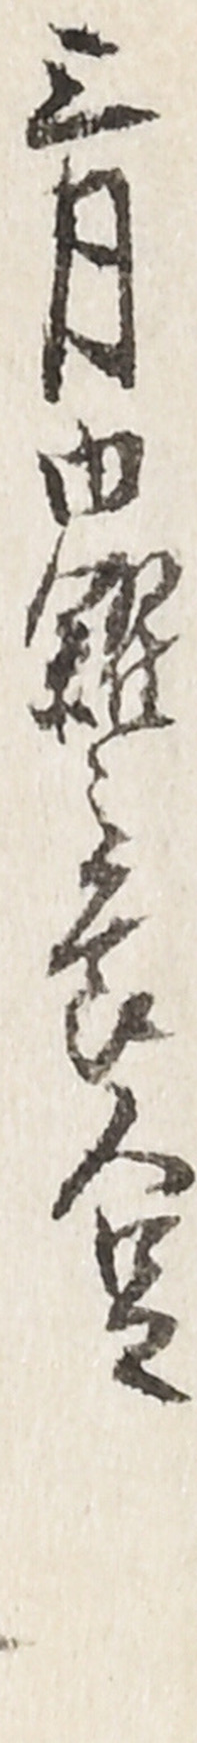一三月御鑼之節人足
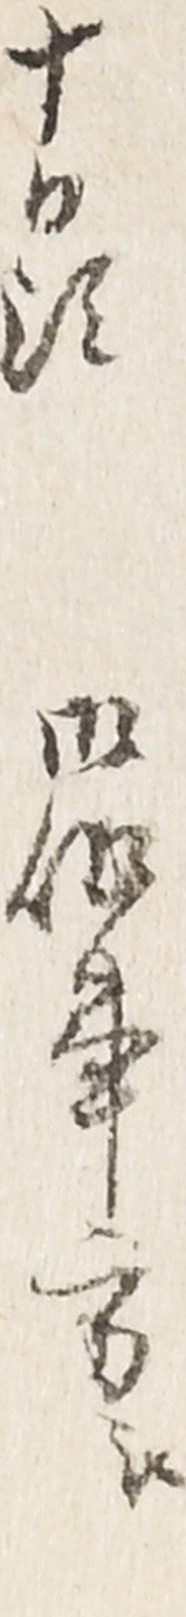十日頃御作事方江
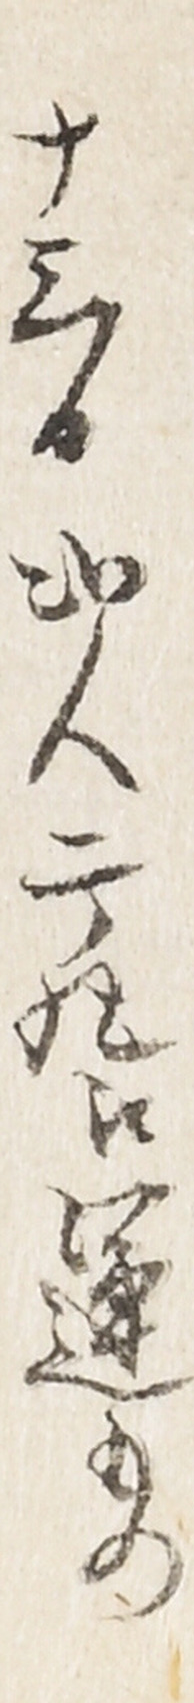十三日二人二ノ丸被運もの
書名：年内行事懐中録
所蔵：伊那市立高遠町図書館・合同会社AMANE
